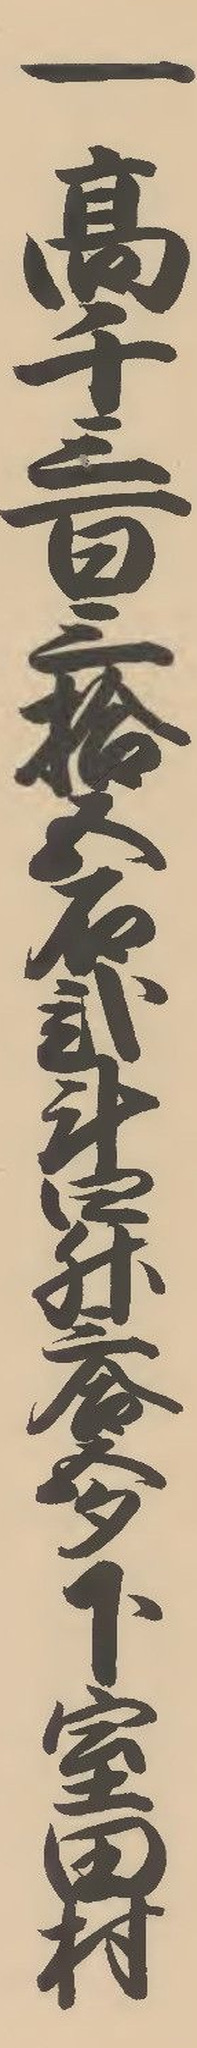一髙千三百三拾五石弐斗四升三合五夕
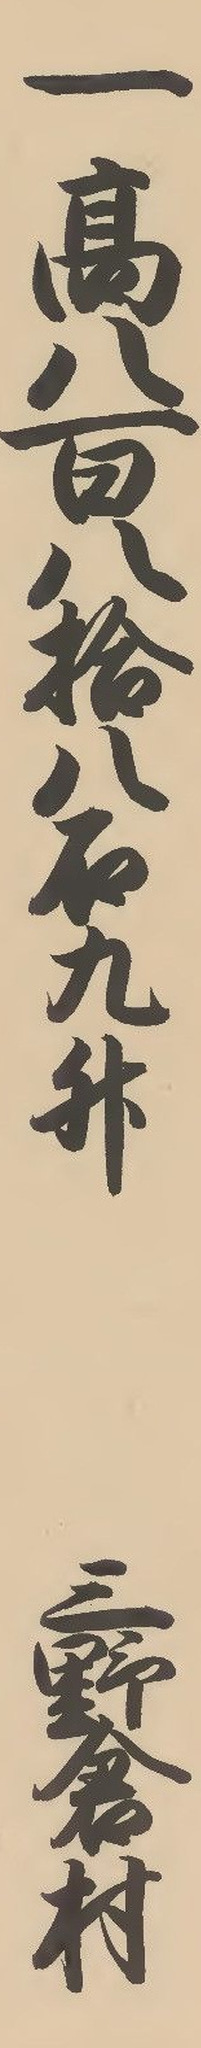一髙八百八拾八石九升三野倉村
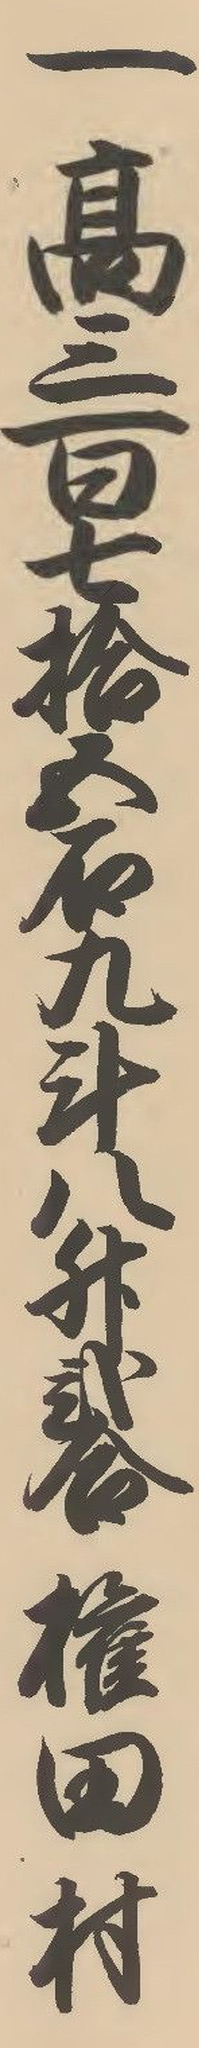一髙三百七拾五石九斗八升弐合権田村
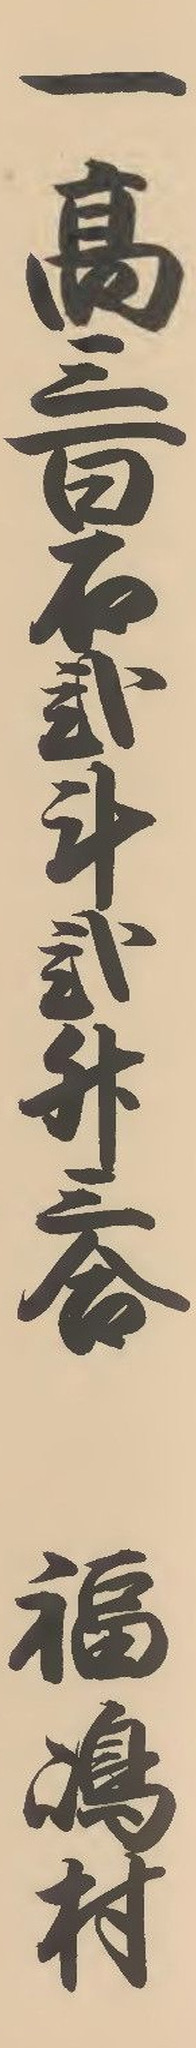一髙三百石弐斗弐升三合福嶋村
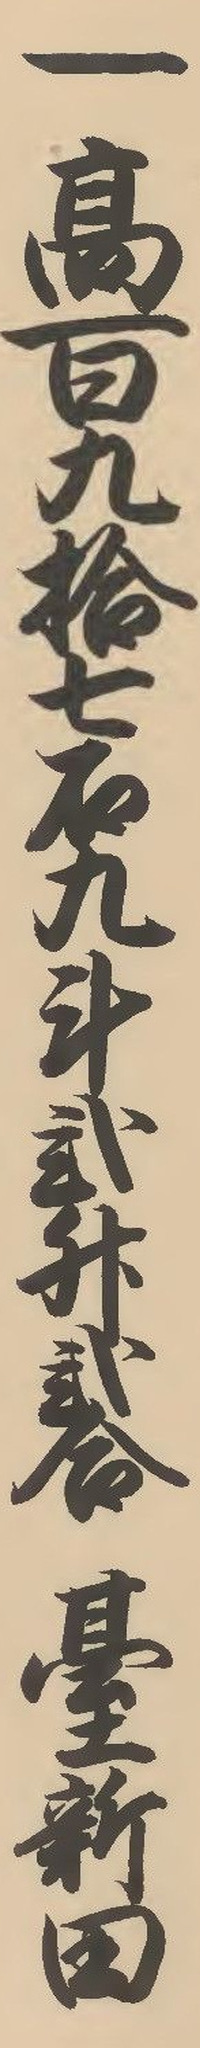一髙百九拾七石九斗弐升弐合臺新田
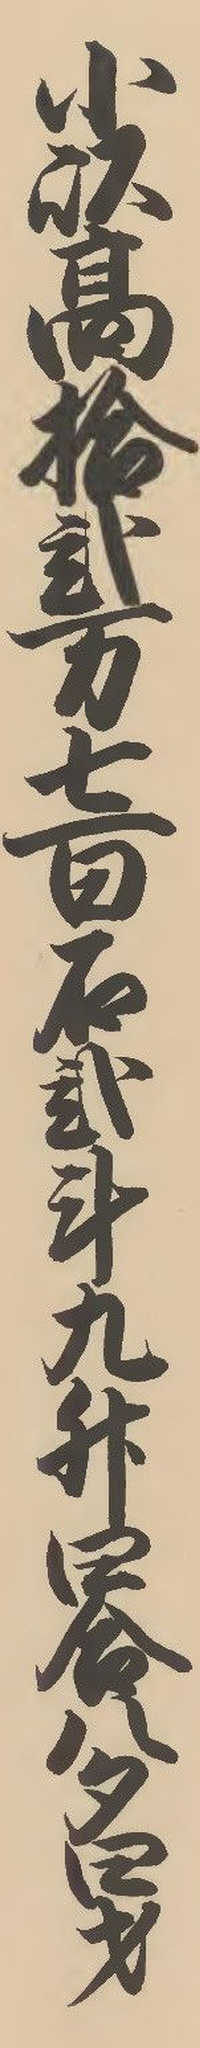小以髙拾弐万七百石弐斗九升四合八夕四才

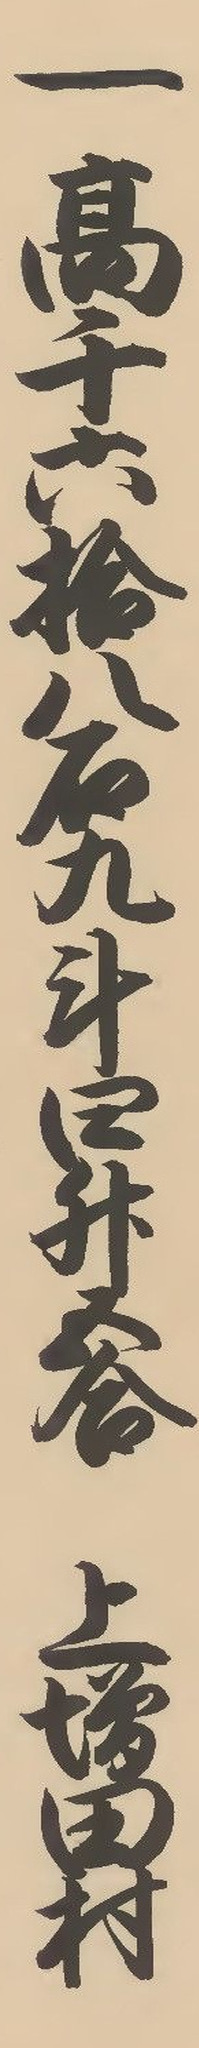一髙千六拾八石九斗四升五合上増田村
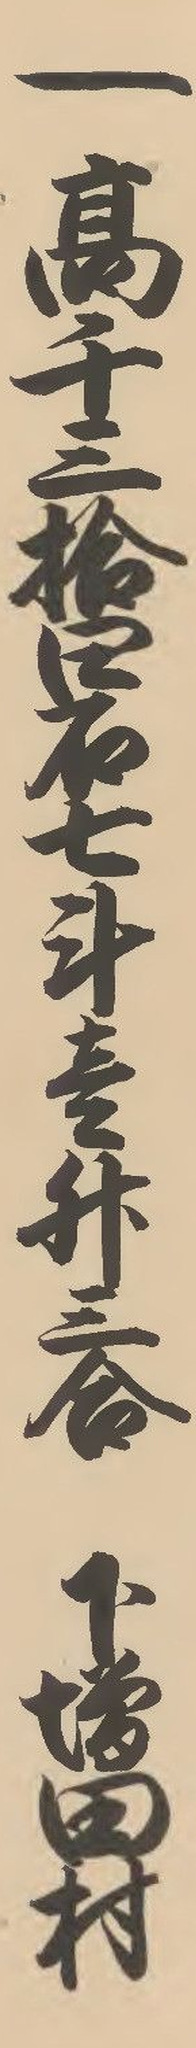一髙千三拾四石七斗壱升三合下増田村
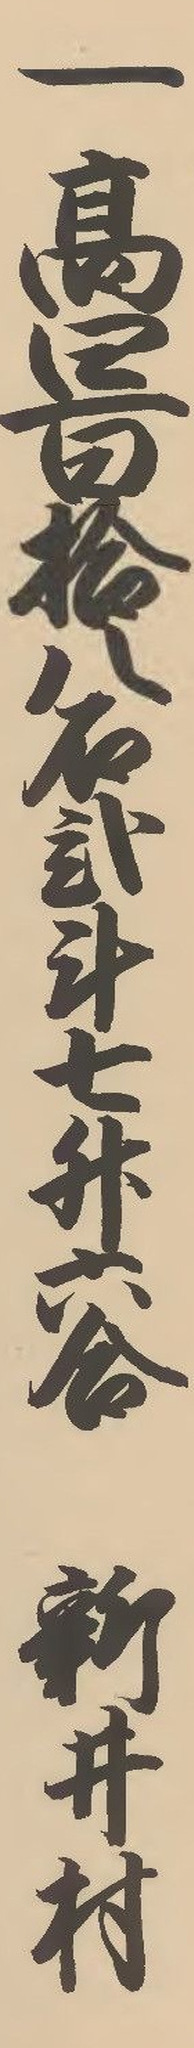一髙四百拾八石壱斗七升六合新井村
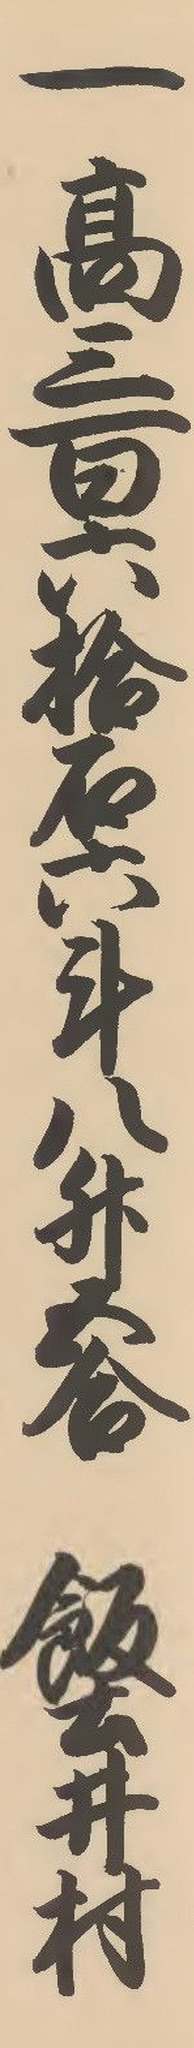一髙三百六拾石六斗八升五合飯土井村
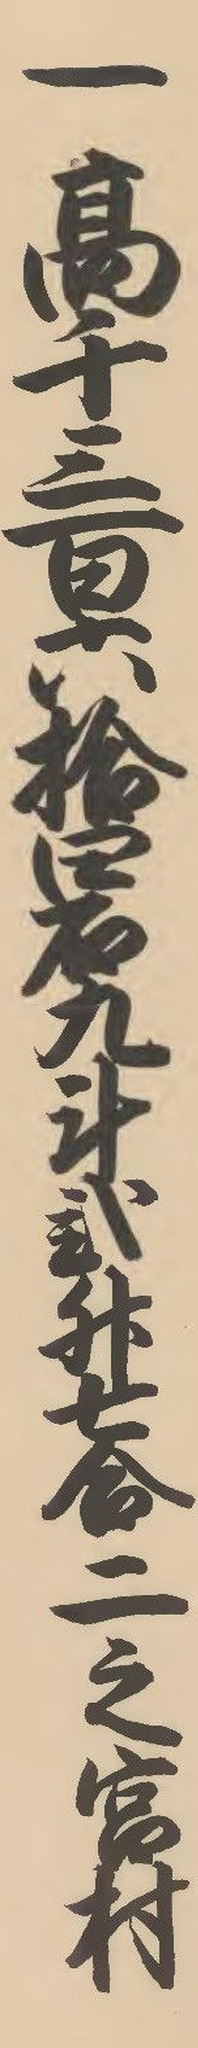一髙千三百六拾四石九斗弐升七合二之宮村
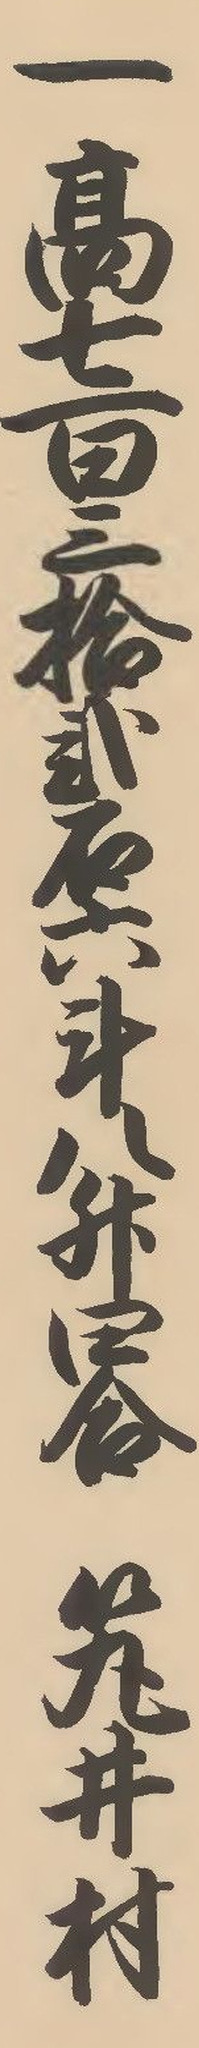一髙七百三拾弐石六斗八升四合笂井村
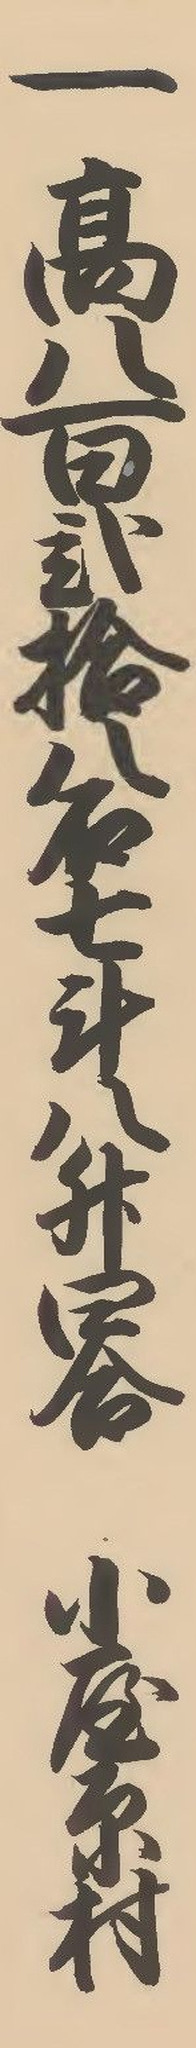一髙八百弐拾八石七斗八升四合小屋原村

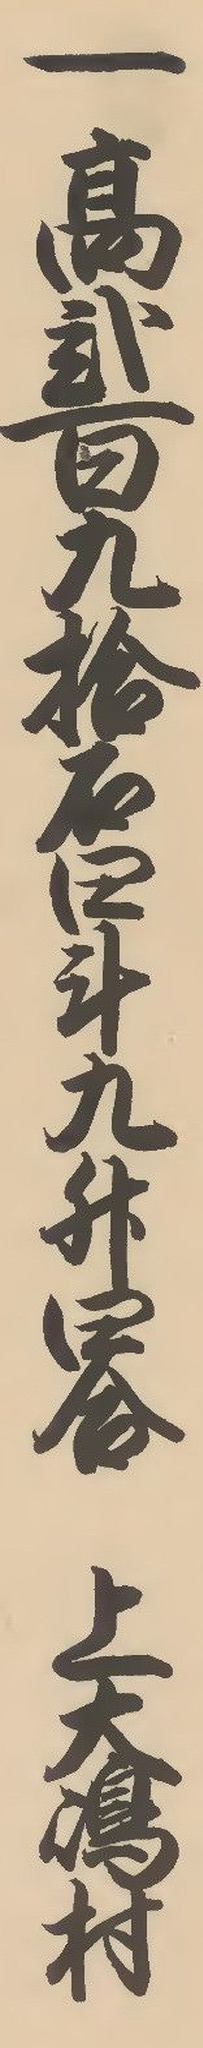一髙弐百九拾石四斗九升四合上大嶋村
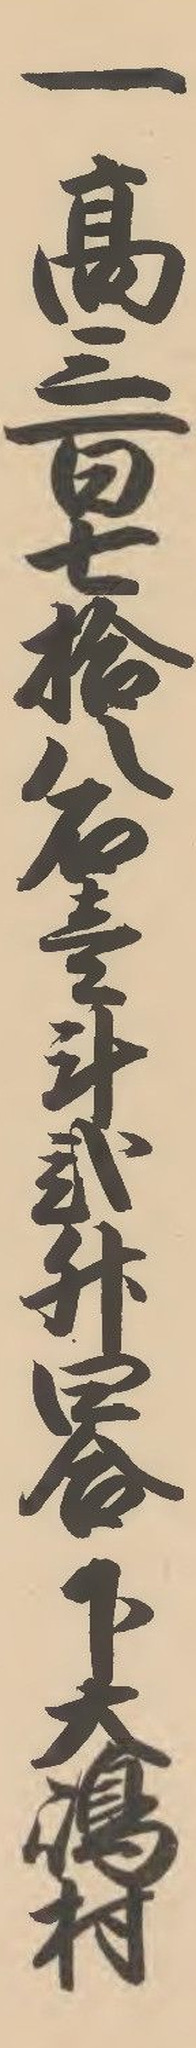一髙三百七拾八石壱斗弐升四合下大嶋村
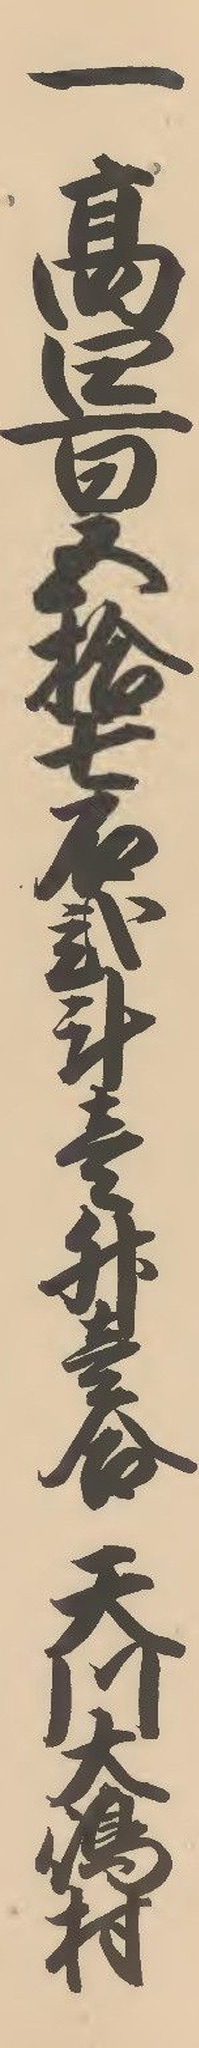一髙四百五拾七石弐斗壱升壱合天川大嶋村
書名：上野国郷帳
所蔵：国立公文書館 National Archives of Japan
